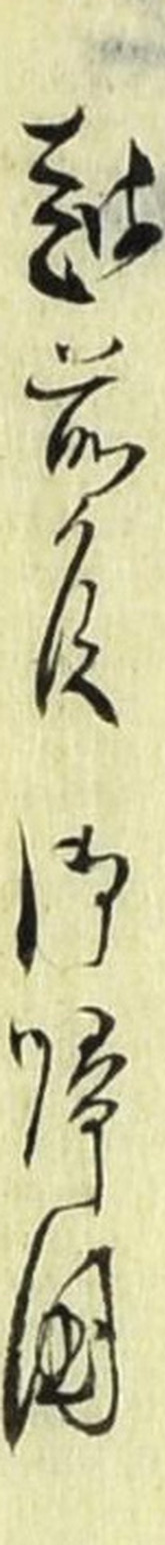越前侯御帰国
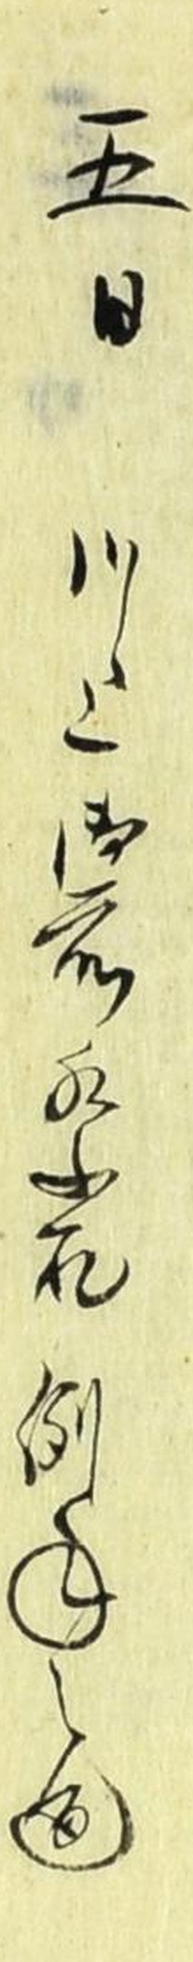五日川上御前祭礼例年之通
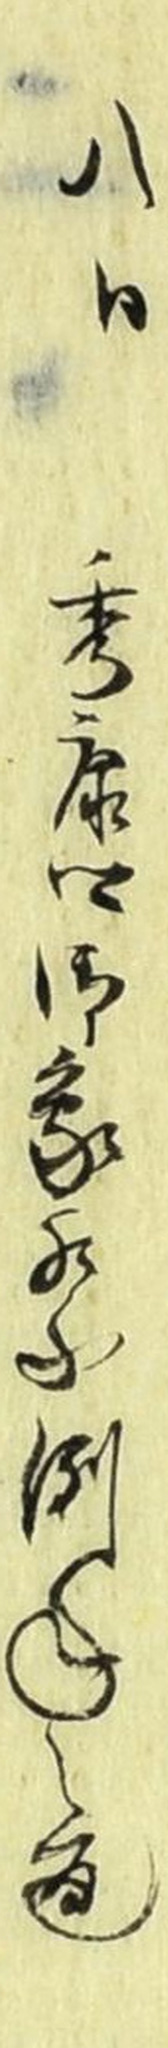八日秀康卿御象祭例年之通
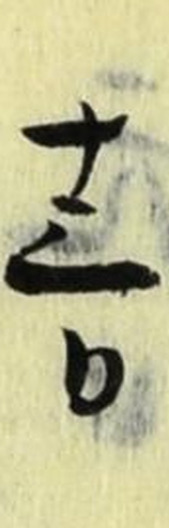十三日
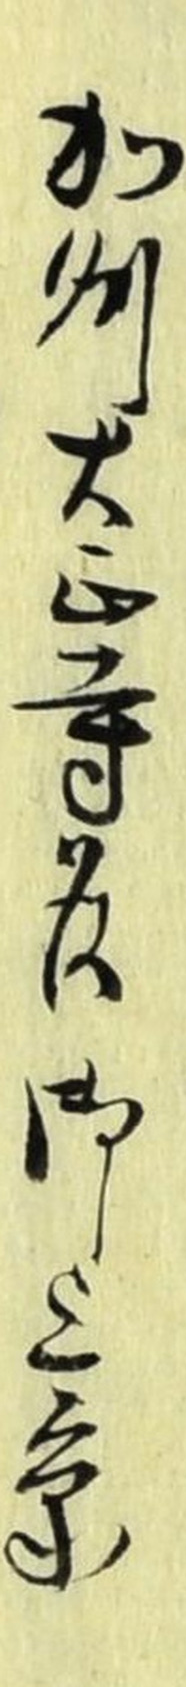加州大正寺侯御上京

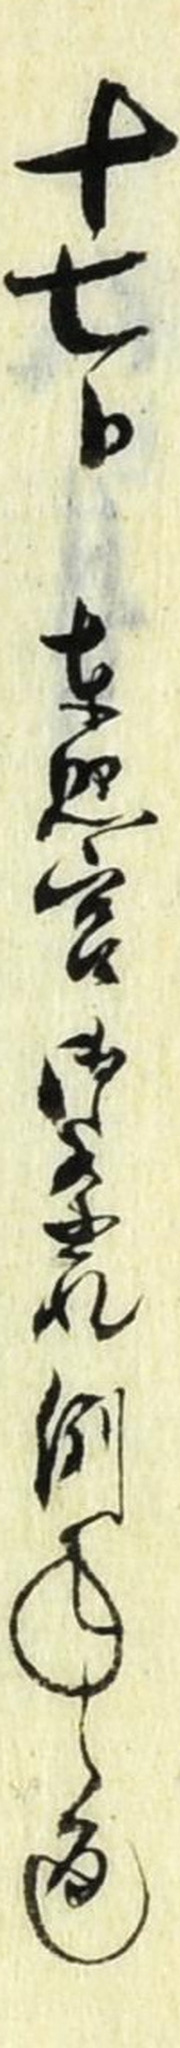十七日東照宮御祭礼例年之通
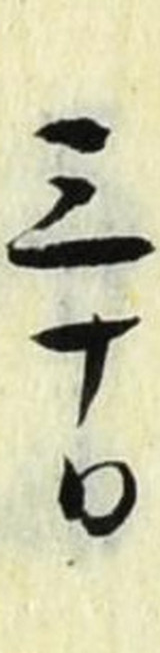三十日
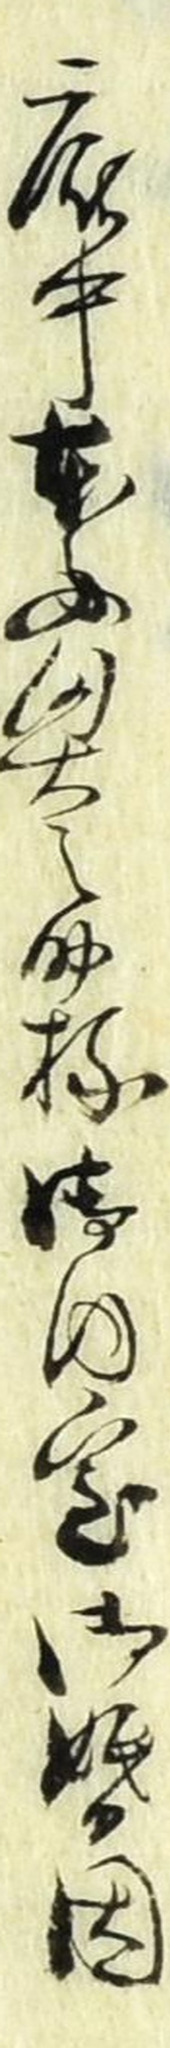府中本多興之助様御内室御婚因
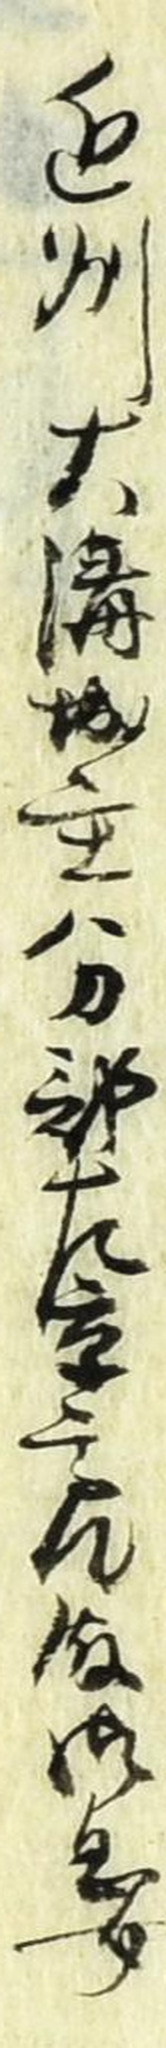近州大溝城主分部左京亮殿御息女
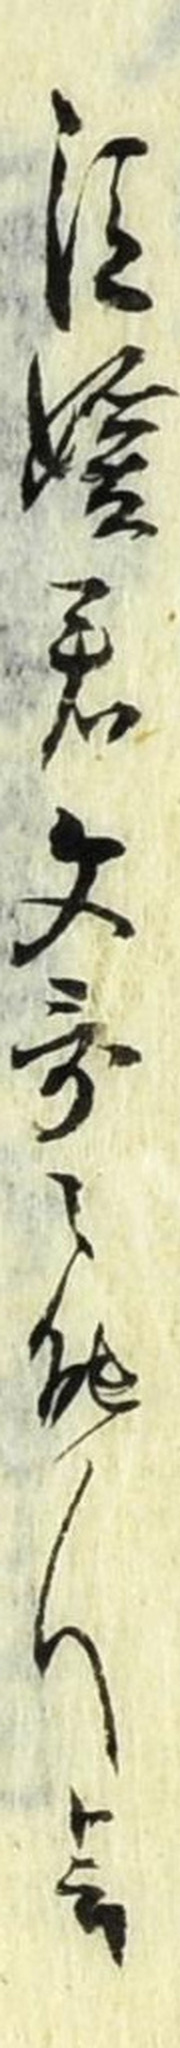清媛君文歌之能人と云
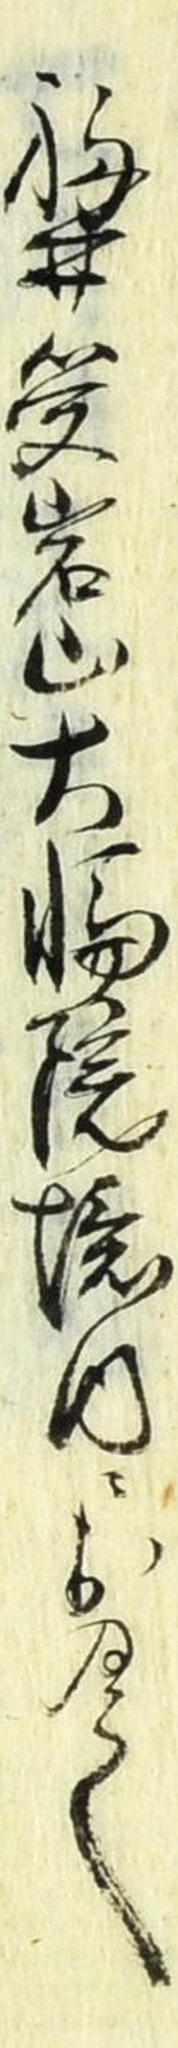福井受岩山大輪院境内におゐて
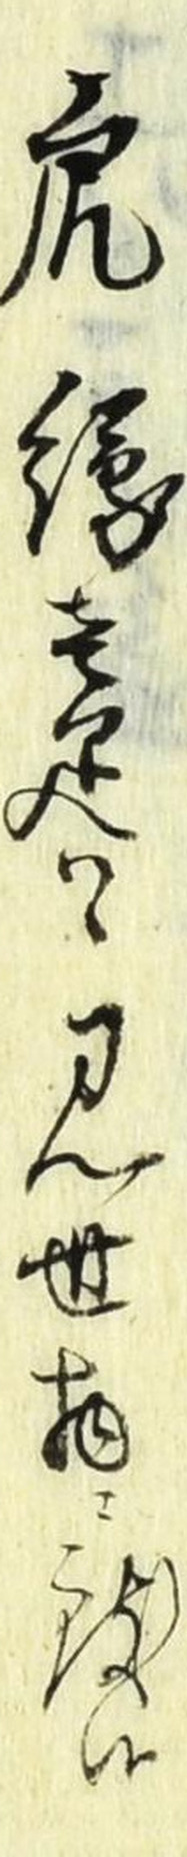虎像壱疋つゝ見世物に致候
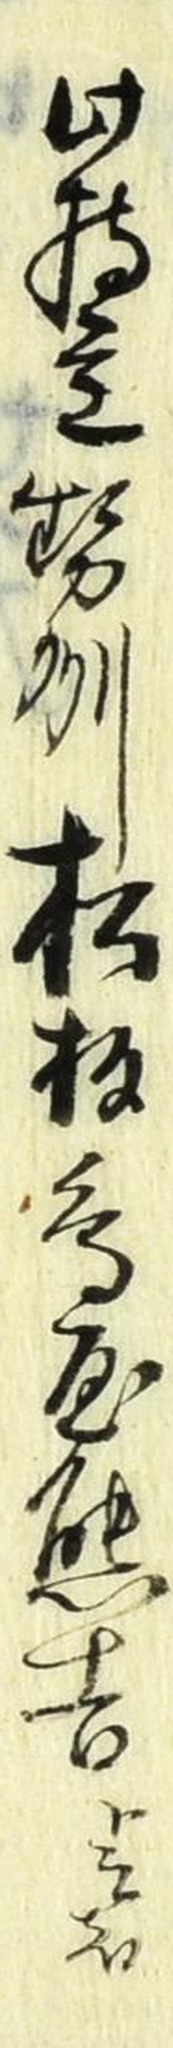此持主勢州松板鳥屋熊吉と云は
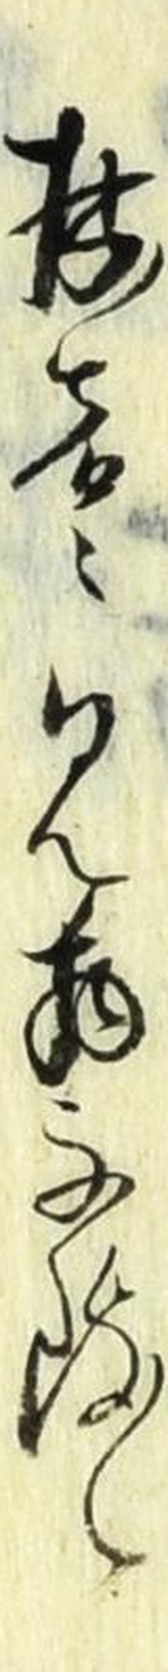拙者に見物被致候
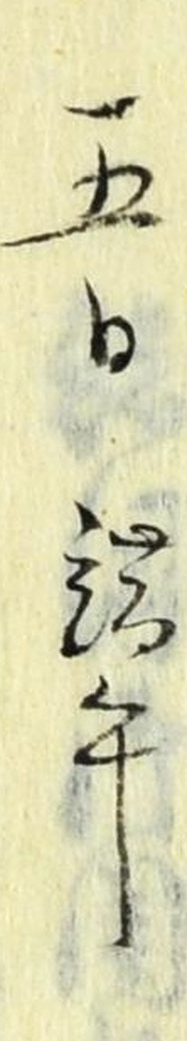五日端午

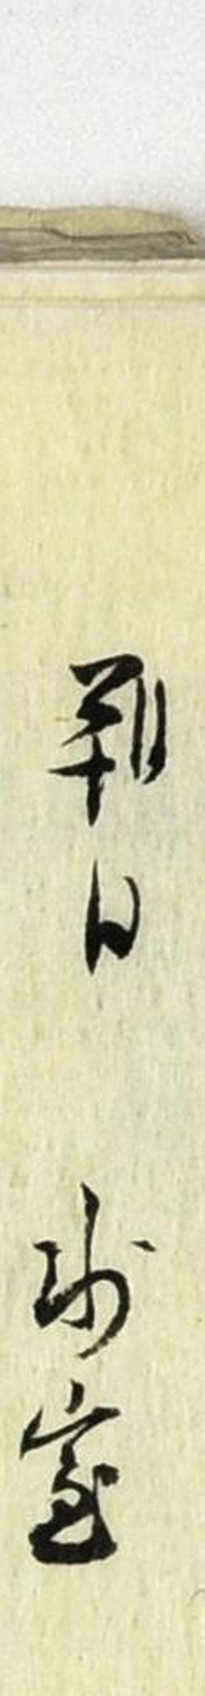朔日氷室
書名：（日記）
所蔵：福井県文書館 Fukui Prefectural Archives
